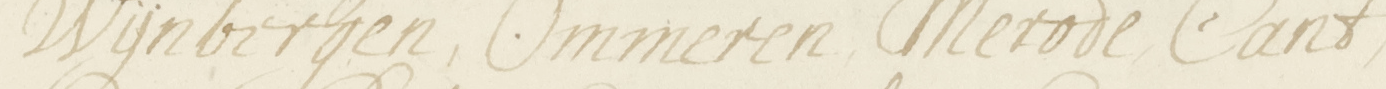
Wijnbergen, Ommeren, Merode Cant,
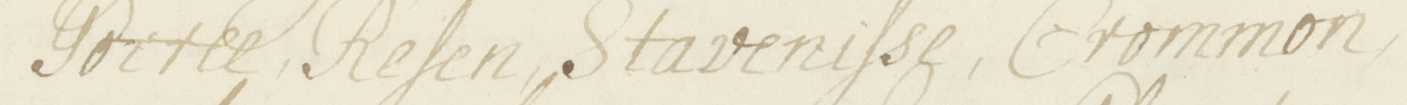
Goeree, Resen, Stavenisse, Crommon,
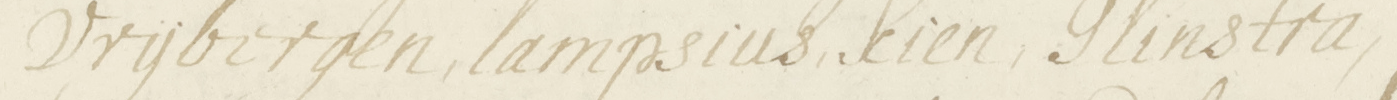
Vrijbergen, Lampsius, Kien, Glinstra,
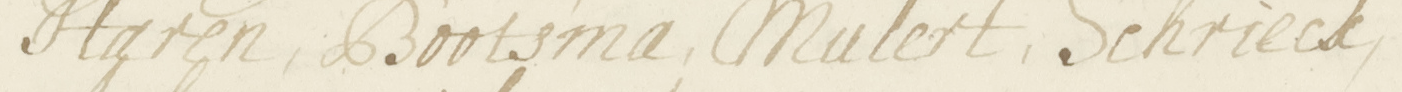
Haren, Bootsma, Mulert, Schrieck,
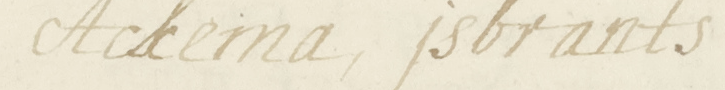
Ackema, Isbrants
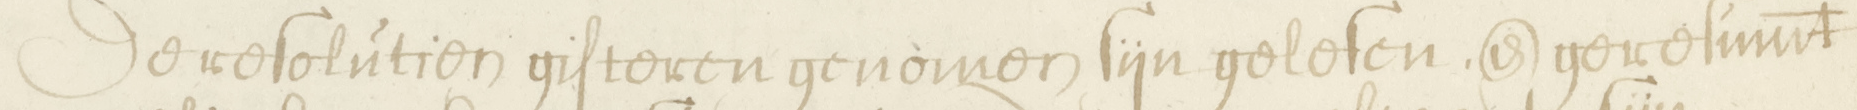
De resolutien gisteren genomen sijn gelesen, & geresumt
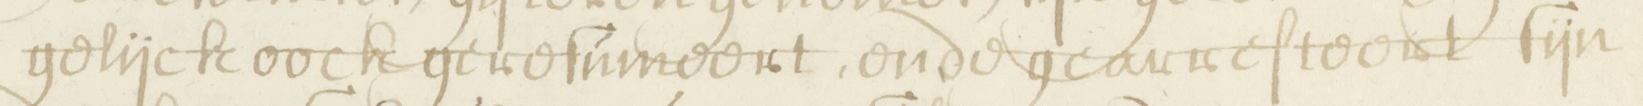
gelijck oock geresumeert, ende gearresteert sijn
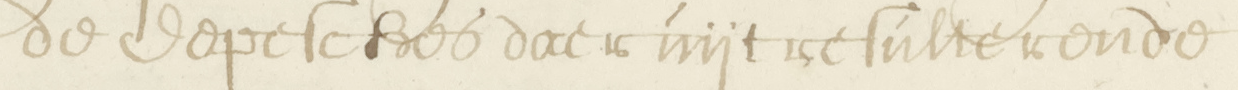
de Depesches daer uijt resulterende
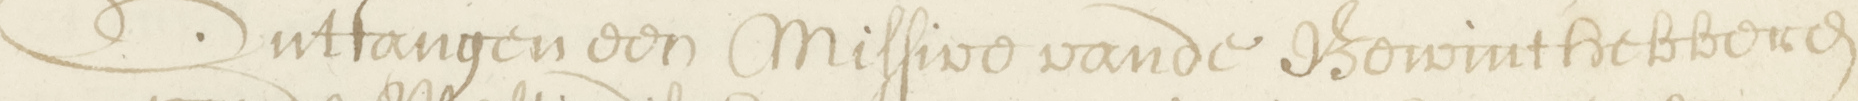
Ontfangen een Missive vande Bewinthebberen
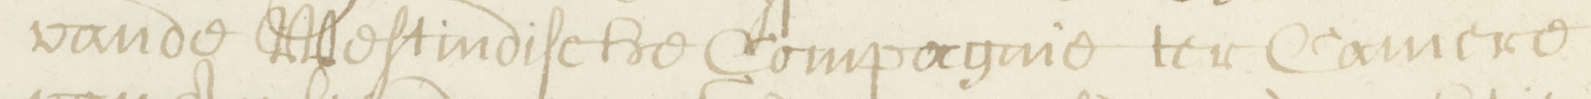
vande Westindische Compagnie ter Camere
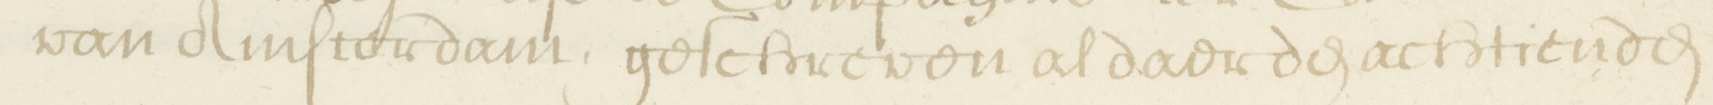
van Amsterdam, geschreven aldaer den achtienden
